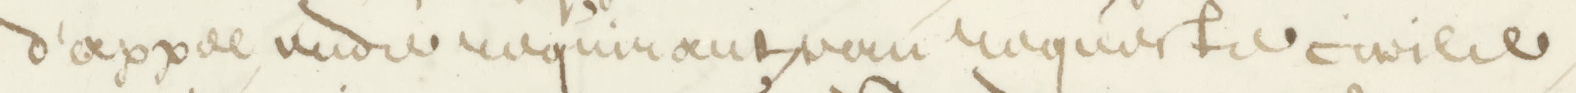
d'appel ende requirant van requeste civile
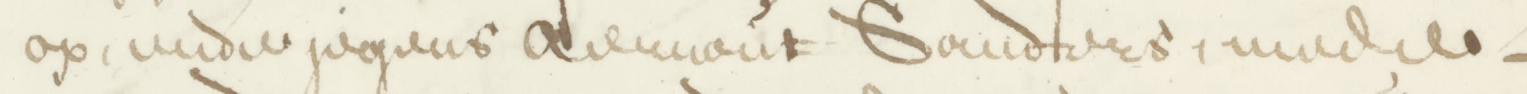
op, ende jegens Aernout Sanders, mede
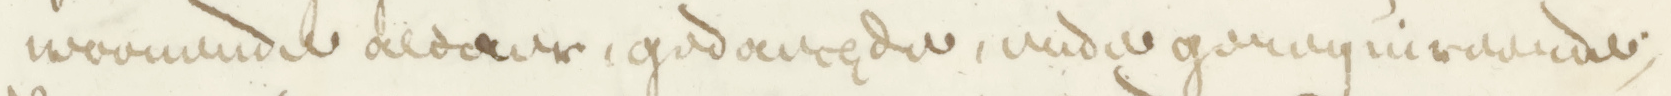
woonende aldaer, gedaechde, ende gerequireerde;
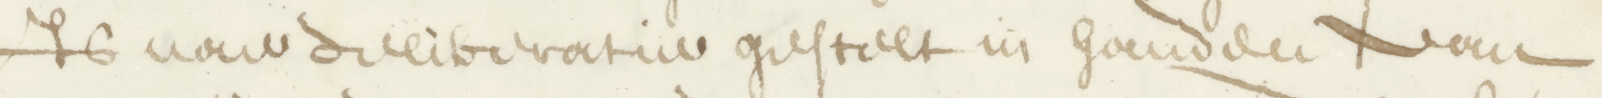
Is nae deliberatie gestelt in handen van
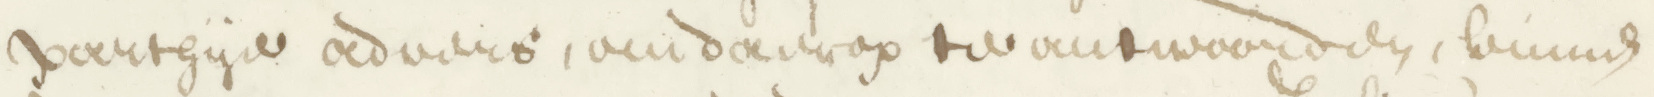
parthije advers, om daerop te antwoorden, binnen
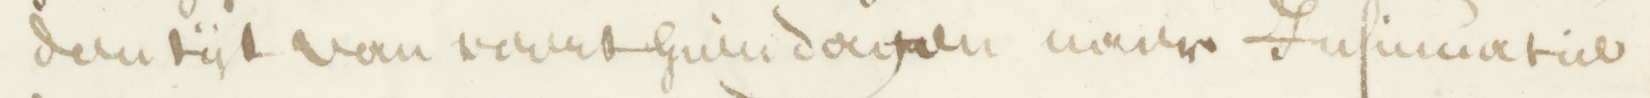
den tijt van veerthien dagen naer Insinuatie
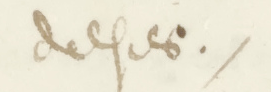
deses.
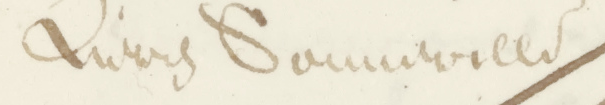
Lieven Sonneville
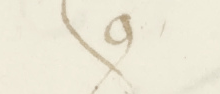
ca.
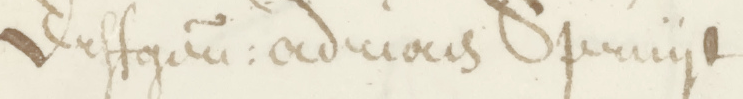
Erffgen: adriaen Spruijt
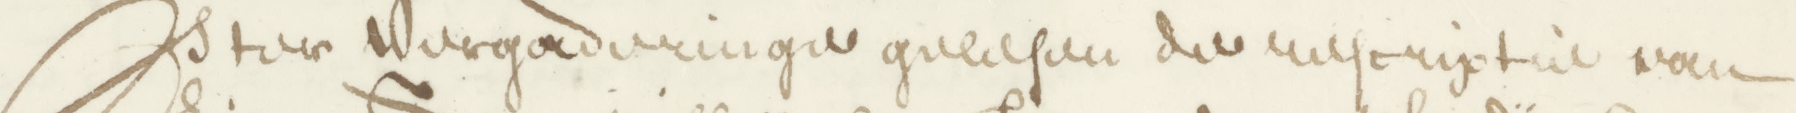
Is ter Vergaderinge gelesen de rescriptie van
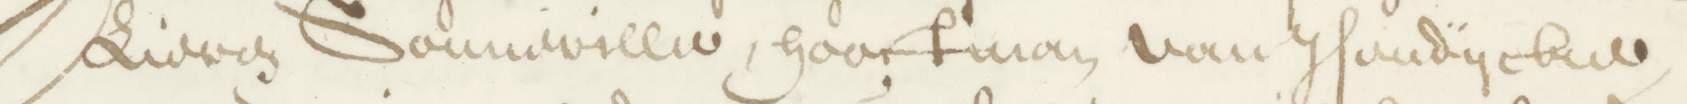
Lieven Sonneville, hooftman van Isendijcke
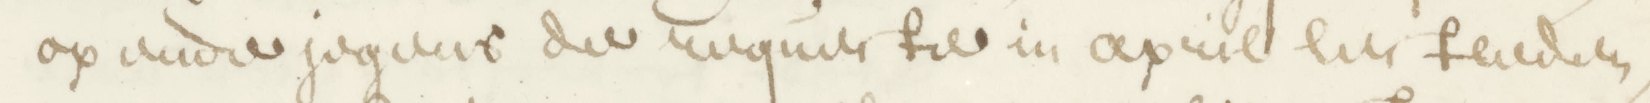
op ende jegens de requeste in april lestleden,
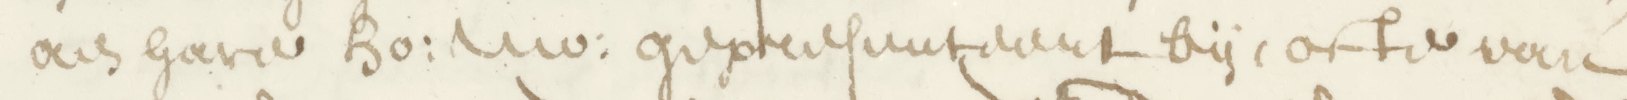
aen hare Ho:Mo: gepresenteert bij, ofte van
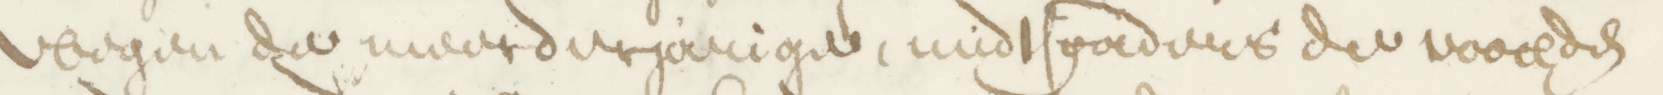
wegen de meerderjarige, midtsgaders de voochden
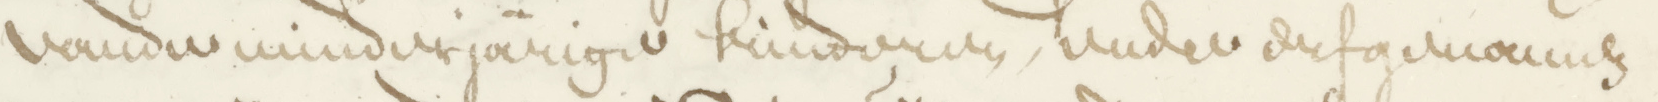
vande minderjarige kinderen, ende erfgenamen
